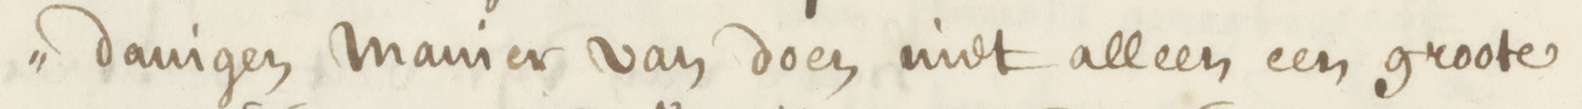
„danigen Manier van doen niet alleen een groote
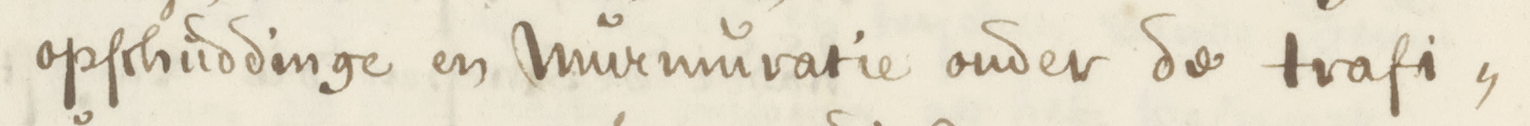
opschuddinge en Murmuratie onder de trafi„
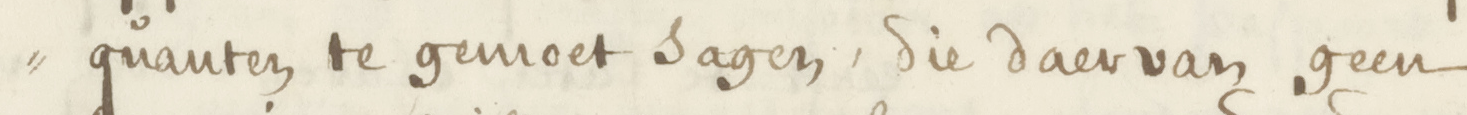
„quanten te gemoet sagen, die daervan geen
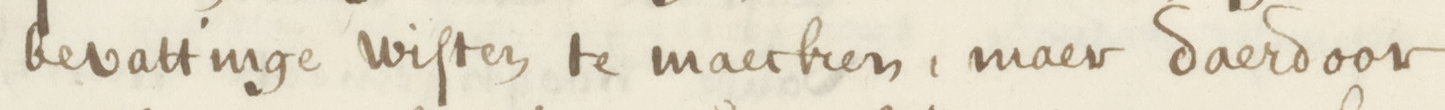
bevattinge wisten te maecken, maer daerdoor
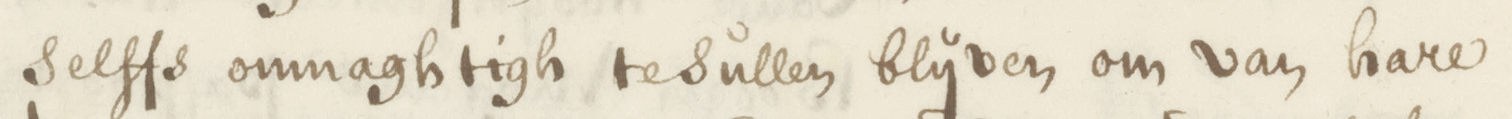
selffs onmaghtigh te sullen blijven om van hare
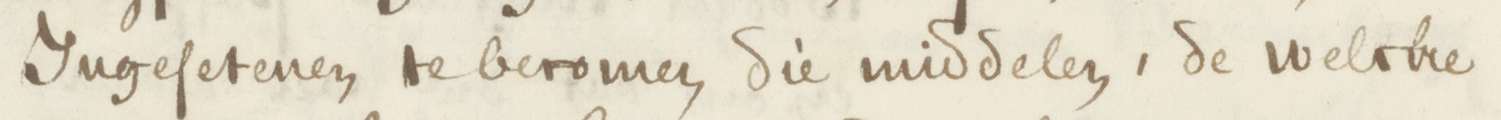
Ingesetenen te becomen die middelen, de welcke
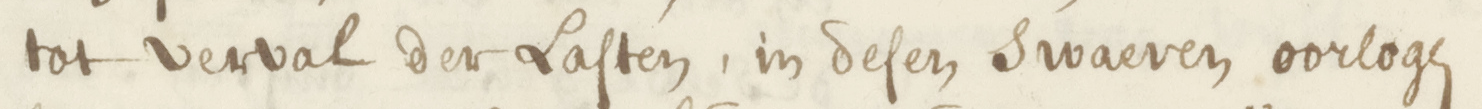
tot verval der Lasten, in desen swaeren oorlogh
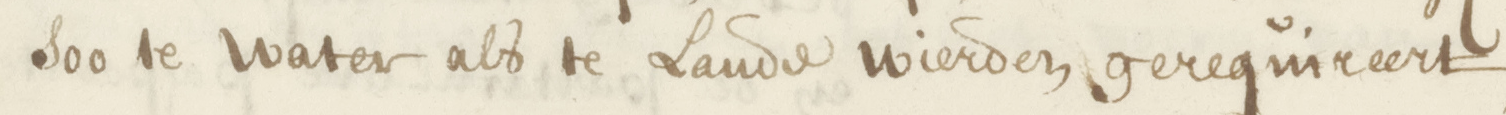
soo te water als te Lande wierden gerequireert,
